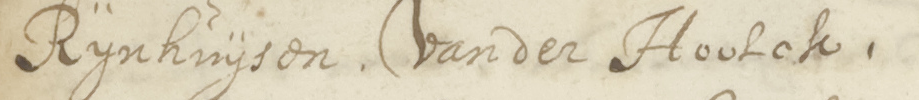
Rijnhuijsen, Van der Hoolck,
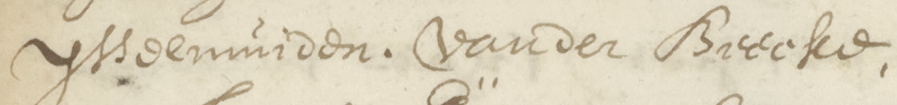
Ysselmuiden, vander Beecke,
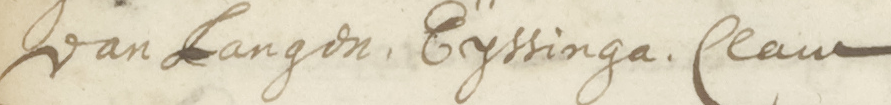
van Langen, Eijssinga, Clant
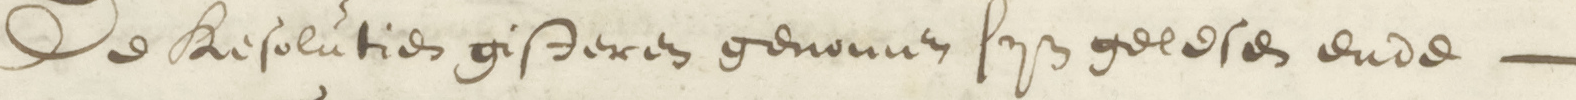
De Resolutien gisteren genomen syn gelesen ende ¬
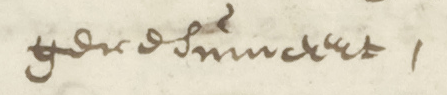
geresumeert.
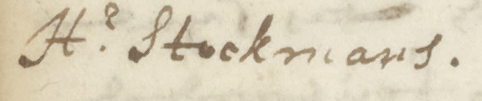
Hr. Stockmans.
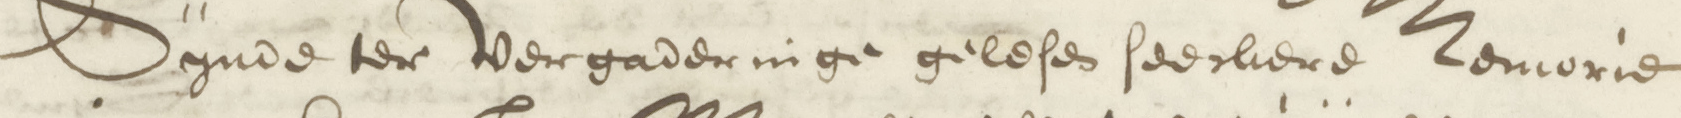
Sijnde ter Vergaderinge gelesen seeckere Memorie
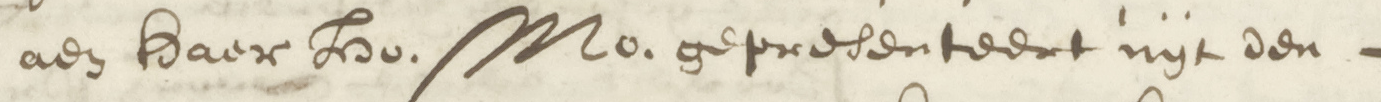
aen haer Ho.Mo. gepresenteert uijt den ¬
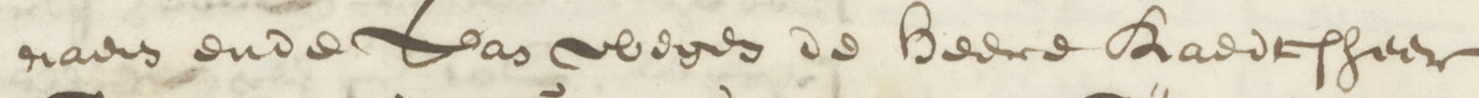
naem ende van wegen de heere Raedtsheere
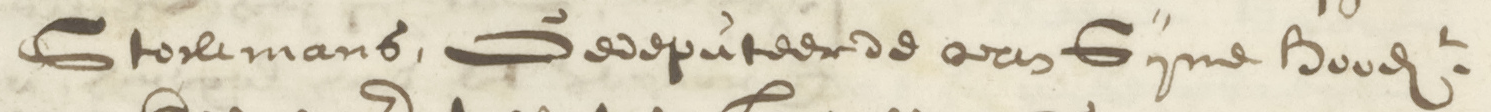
Stockmans, Gedeputeerde van Sijne Hoocht.
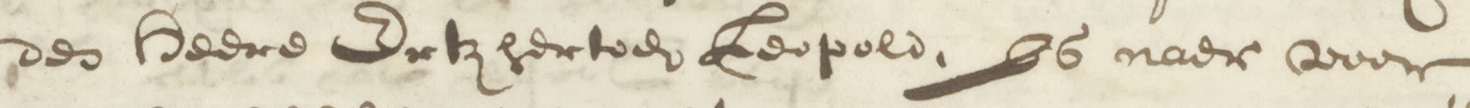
den Heere Ertzhertoch Leopold. Is naer voor„
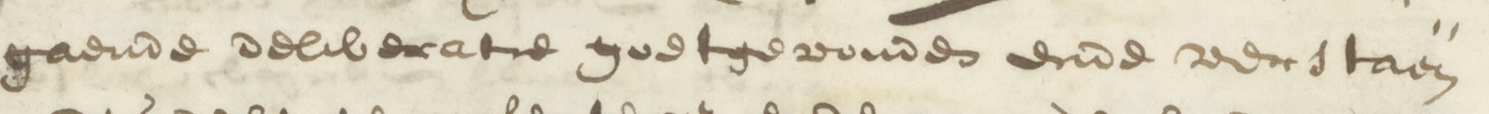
gaende deliberatie goetgevonden ende verstaen
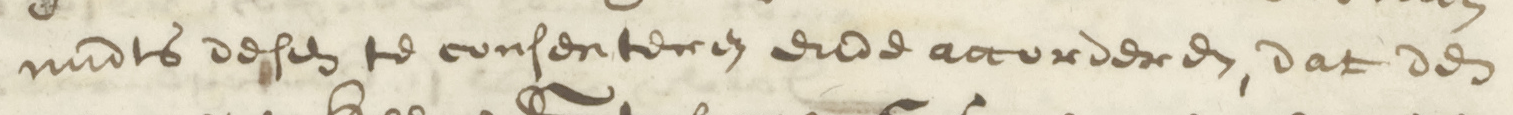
midts desen te consenteren ende accorderen, dat den
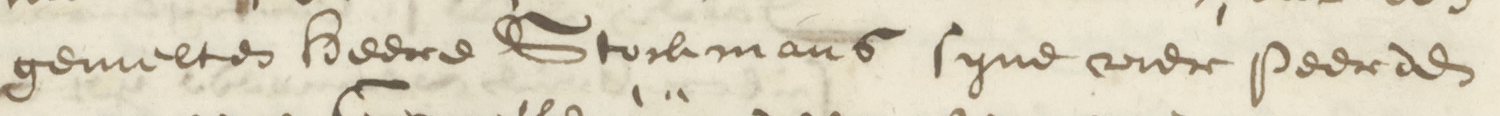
gemelten heere Stockmans syne vier peerden
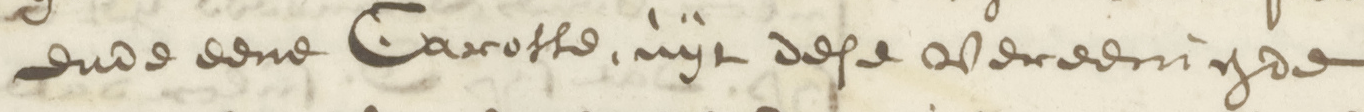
ende eene Carosse, uijt dese Vereenigde
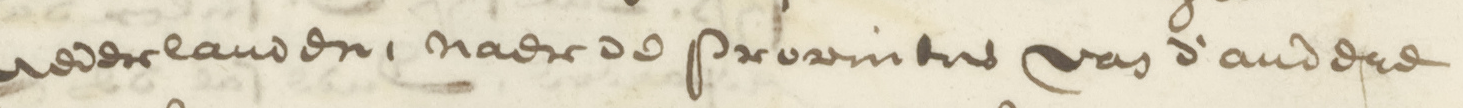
Nederlanden, naer de provintie van d'andere
